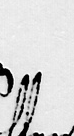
len,
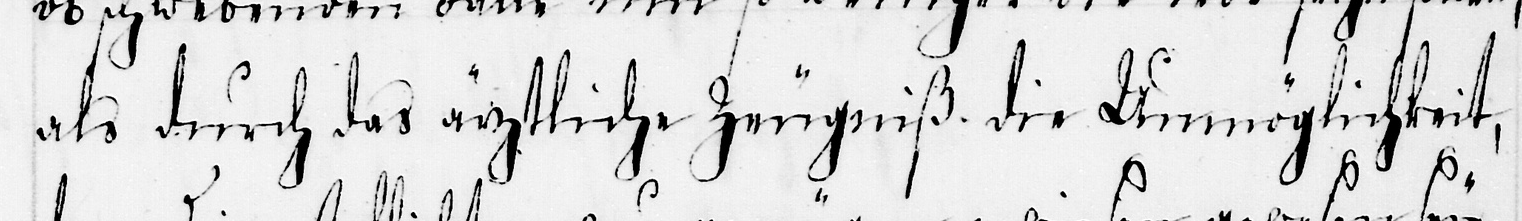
als durch das ärztliche Zeugniß die Unmöglichkeit,
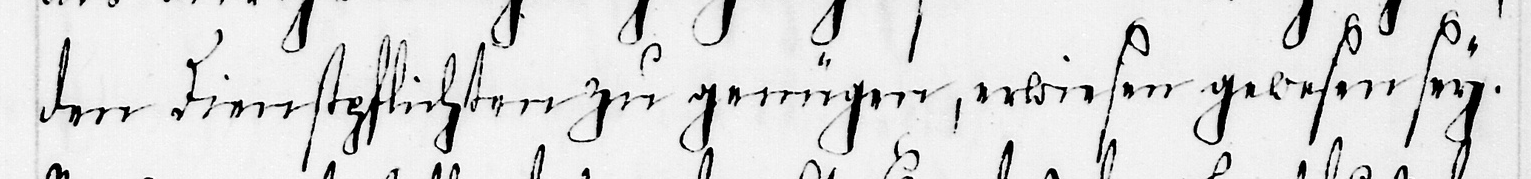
den Dienstpflichten zu genügen, erwiesen gewesen sey.
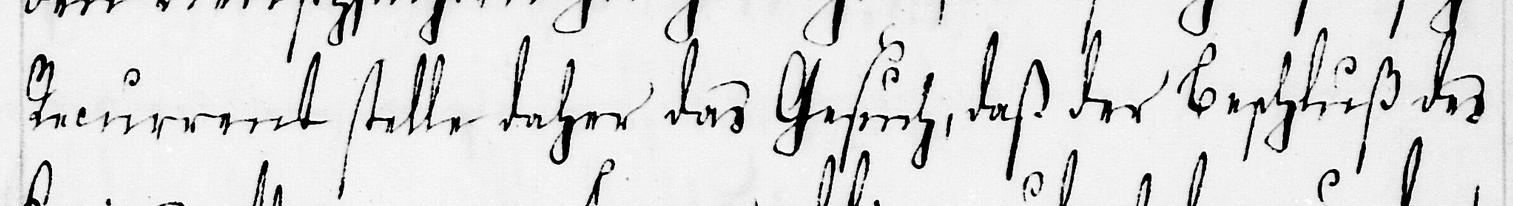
Recurrent stelle daher das Gesuch, daß der Beschluß des
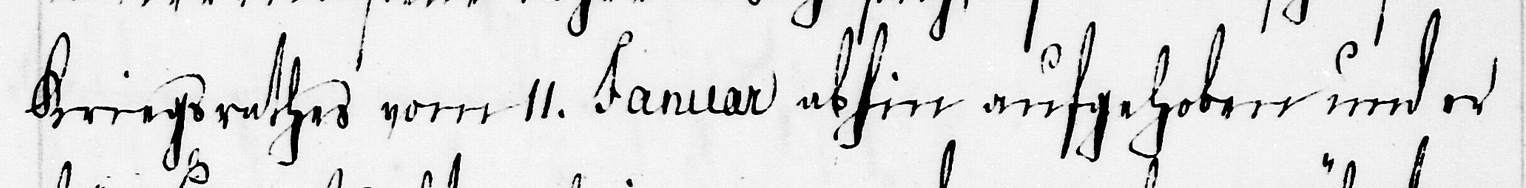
Kriegsrathes vom 11. Januar abhin aufgehoben und er
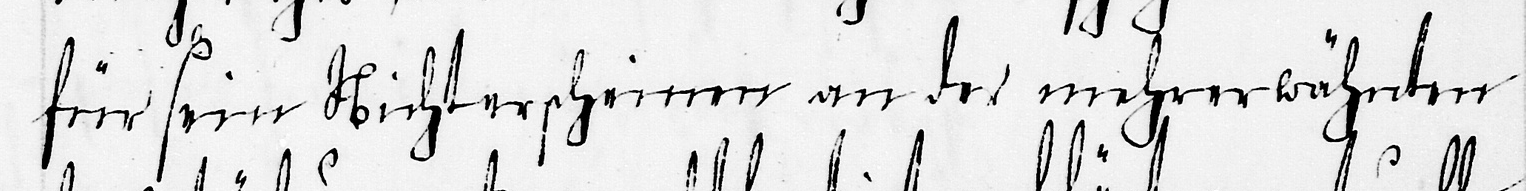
für sein Nichterscheinen an der mehrerwähnten
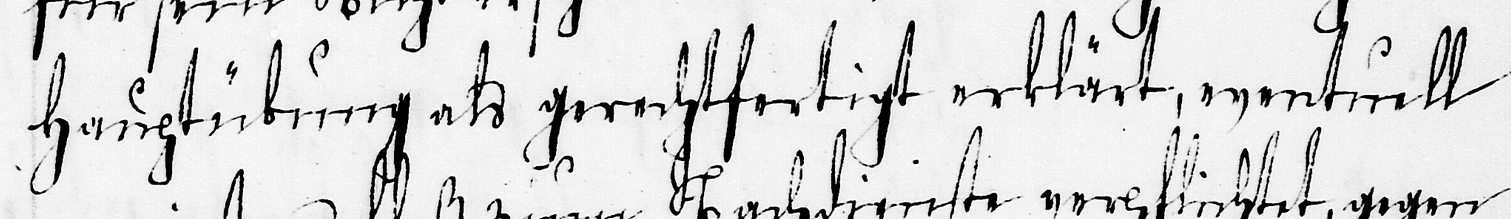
Hauptübung als gerechtfertigt erklärt, eventuell
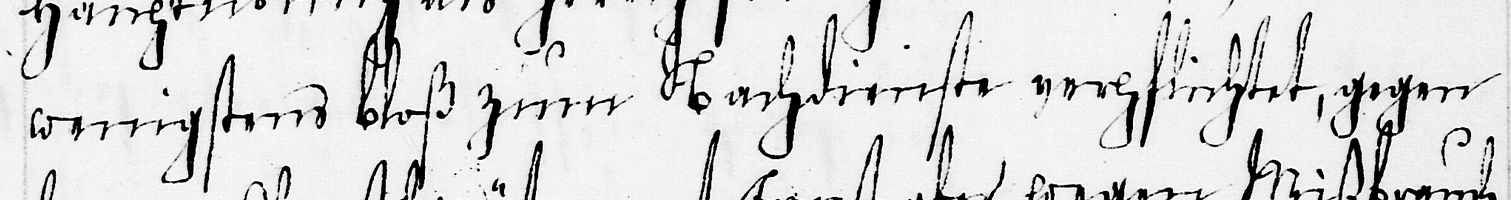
wenigstens bloß zum Nachdienste verpflichtet, gegen
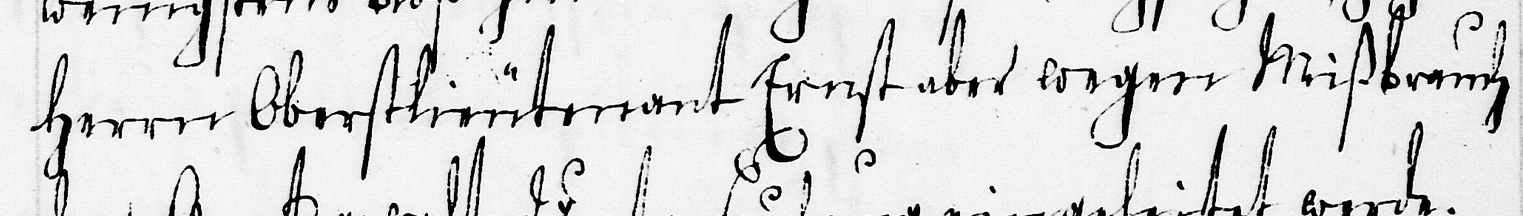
Herrn Oberstlieutenant Ernst aber wegen Mißbrauch
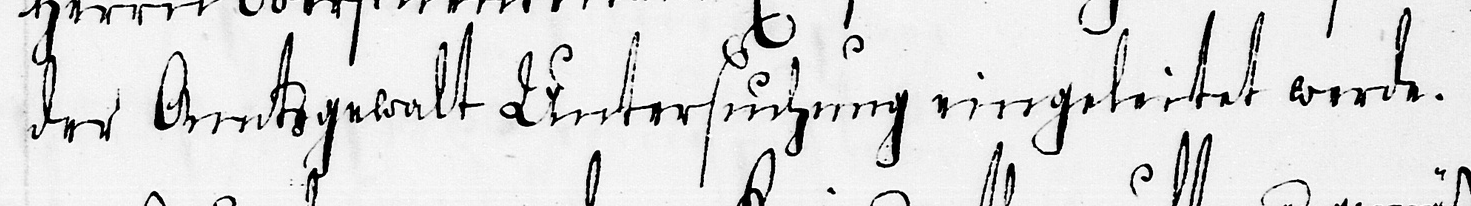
der Amtsgewalt Untersuchung eingeleitet werde.
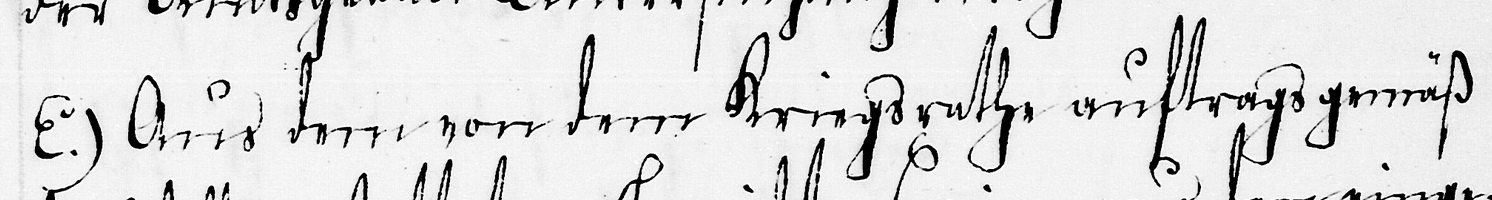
E.) Aus dem von dem Kriegsrathe auftragsgemäß
